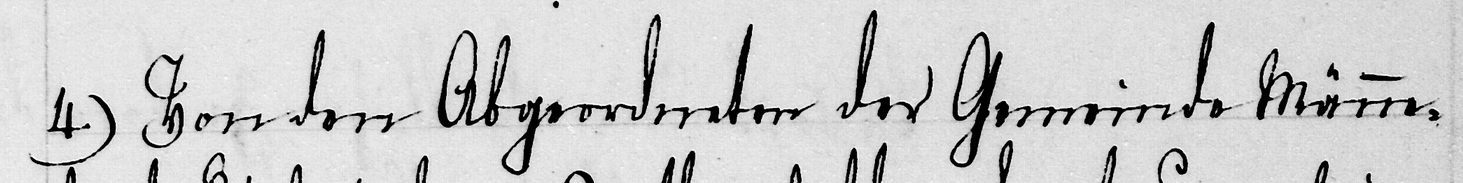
4.) Von den Abgeordneten der Gemeinde Männe¬
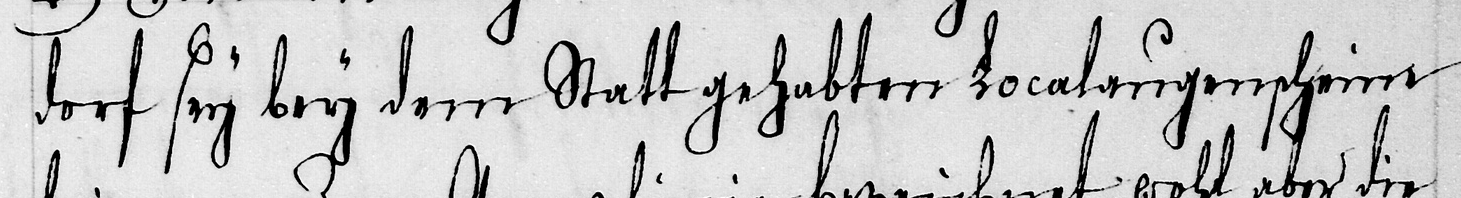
dorf sey bey dem Statt gehabten Localaugenscheine
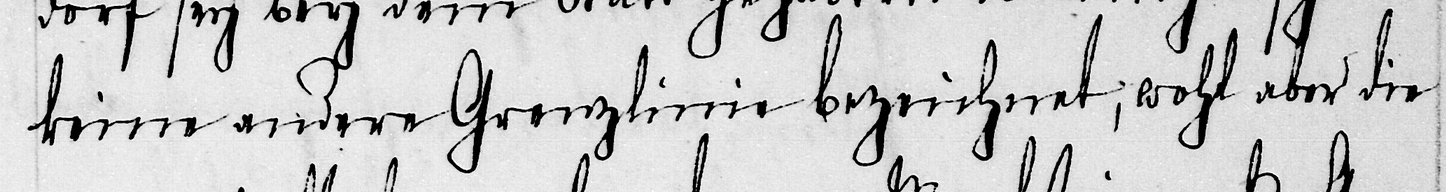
keine andere Grenzlinie bezeichnet, wohl aber die
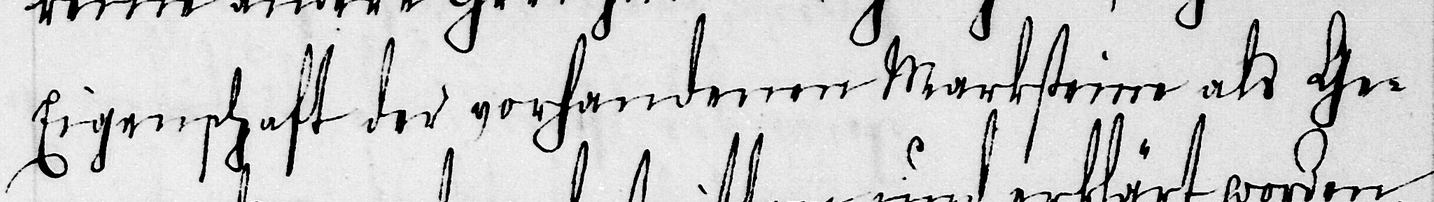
Eigenschaft der vorhandenen Marksteine als Ge¬
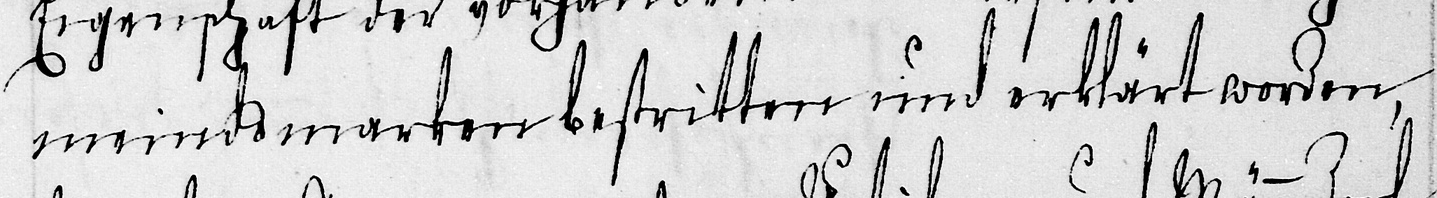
meindsmarken bestritten und erklärt worden,
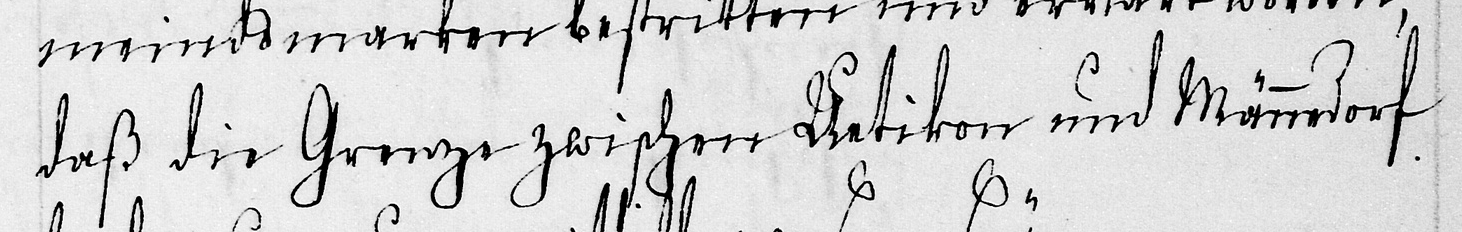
daß die Grenze zwischen Uetikon und Männedorf
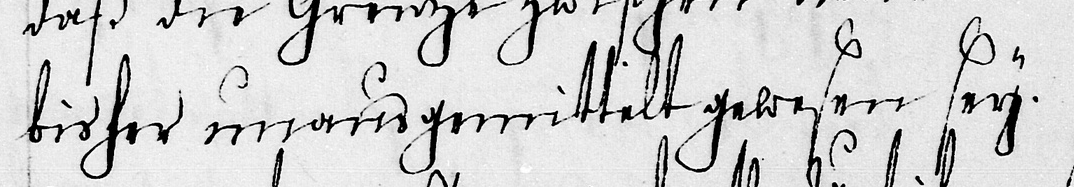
bisher unausgemittelt gewesen sey.
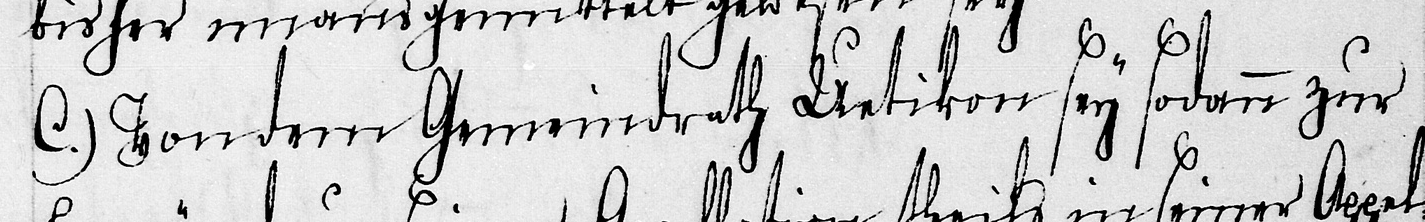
C.) Von dem Gemeindrath Uetikon sey sodann zur
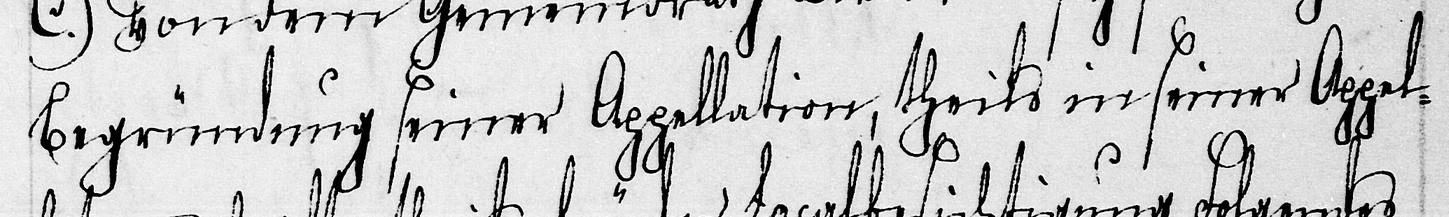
Begründung seiner Appellation, theils in seiner Appel¬
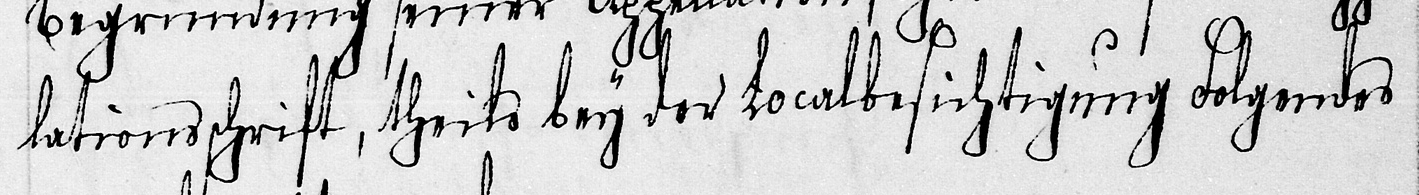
lationsschrift, theils bey der Localbesichtigung Folgendes
